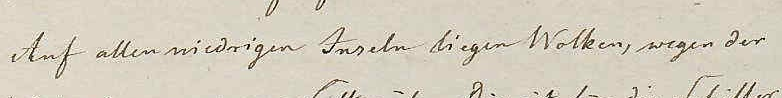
Auf allen niedrigen Inseln liegen Wolken, wegen der
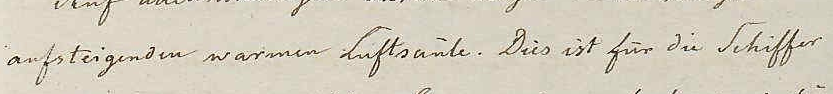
aufsteigenden warmen Luftsäule. Dies ist für die Schiffer
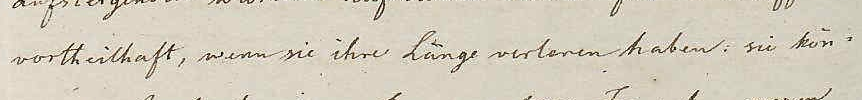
vortheilhaft, wenn sie ihre Länge verloren haben: sie kön-
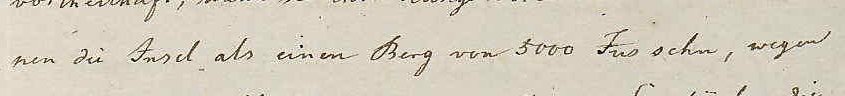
nen die Insel als einen Berg von 5000 Fus sehn, wegen
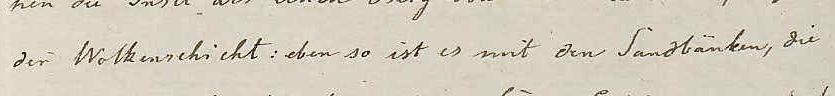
der Wolkenschicht: eben so ist es mit den Sandbänken, die
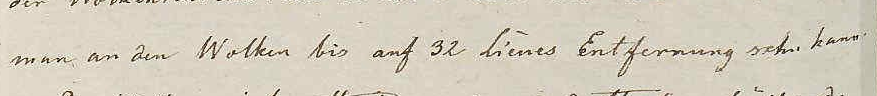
man an den Wolken bis auf 32 Lieues eEntfernung sehn kann.
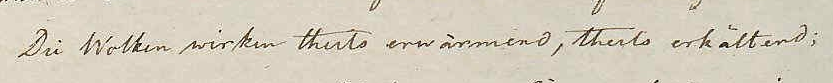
Die Wolken wirken theils erwärmend, theils erkältend;
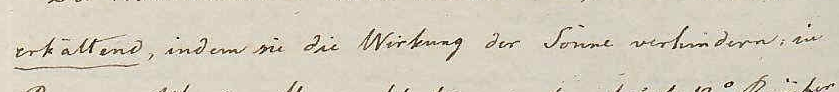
erkältend, indem sie die Wirkung der Sonne verhindern; in
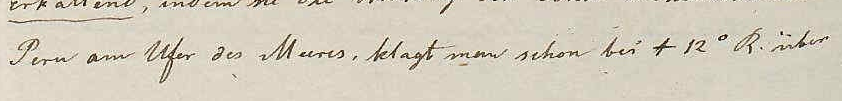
Peru am Ufer des Meeres, klagt man schon bei +12° R. über
